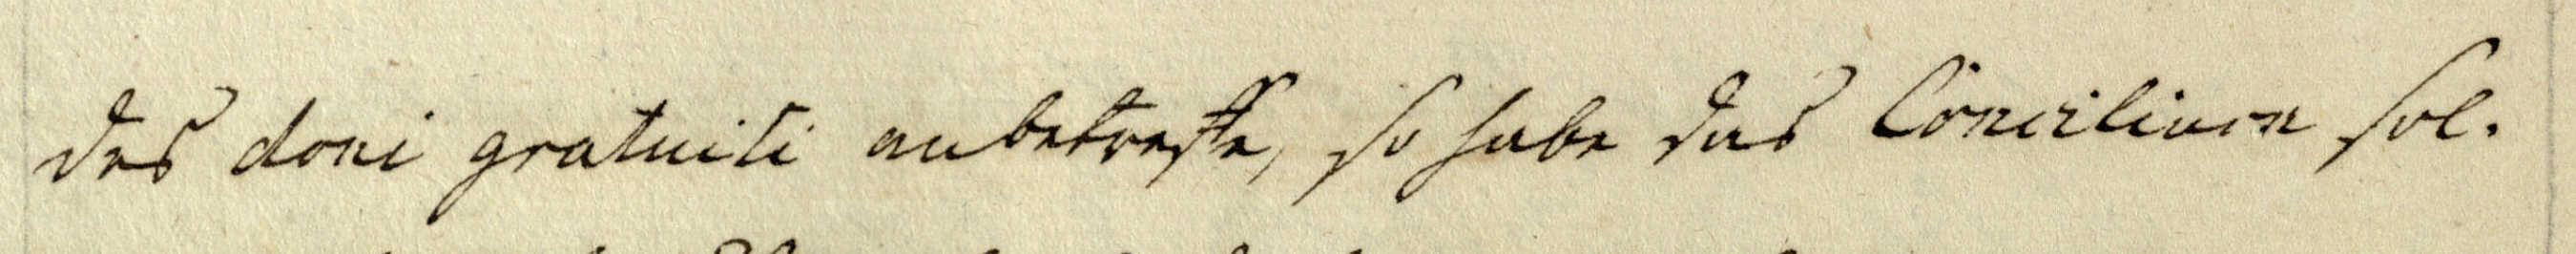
des doni gratuiti anbetreffe, so habe das Concilium sol¬
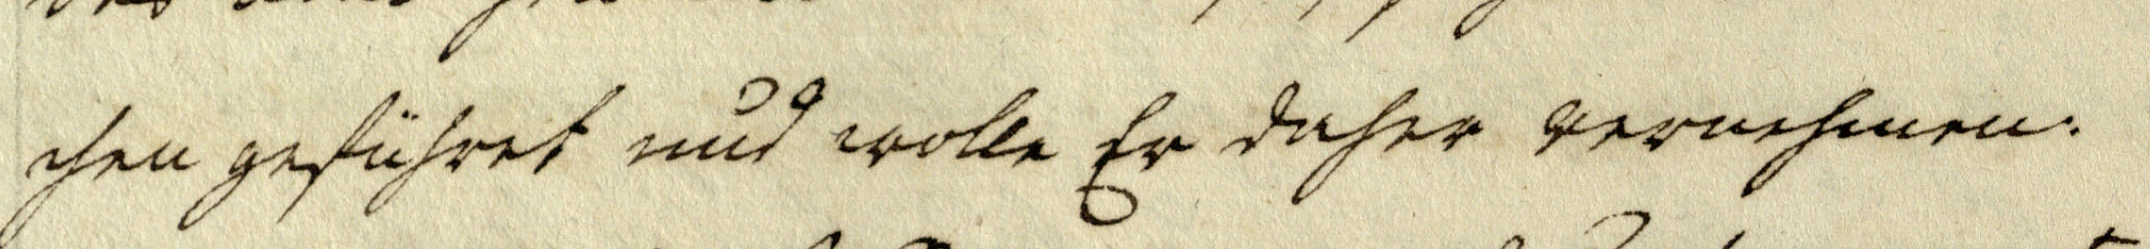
chen geführet und wolle Er daher vernehmen:
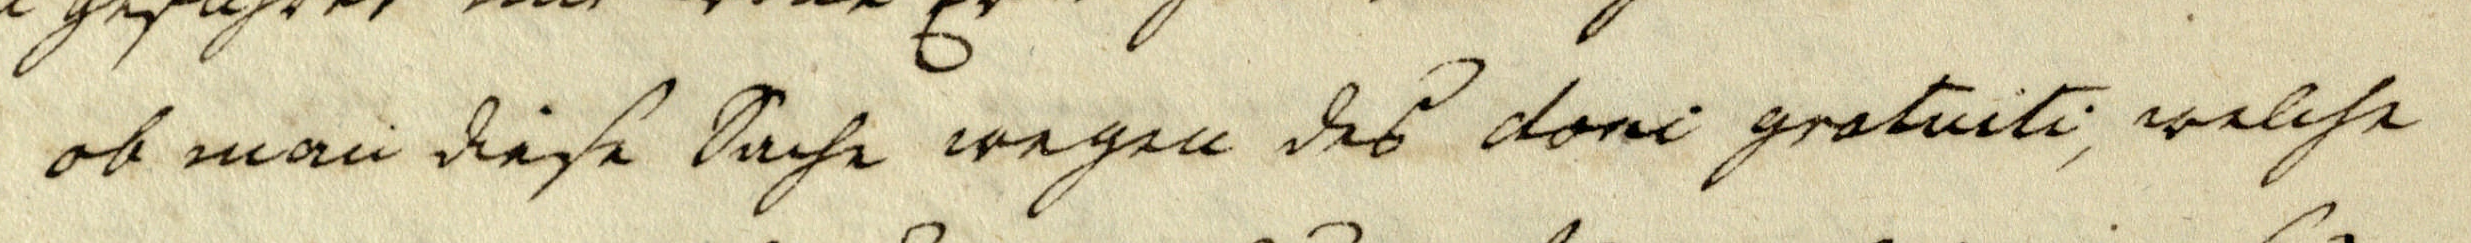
ob man diese Sache wegen des doni gratuiti, welche
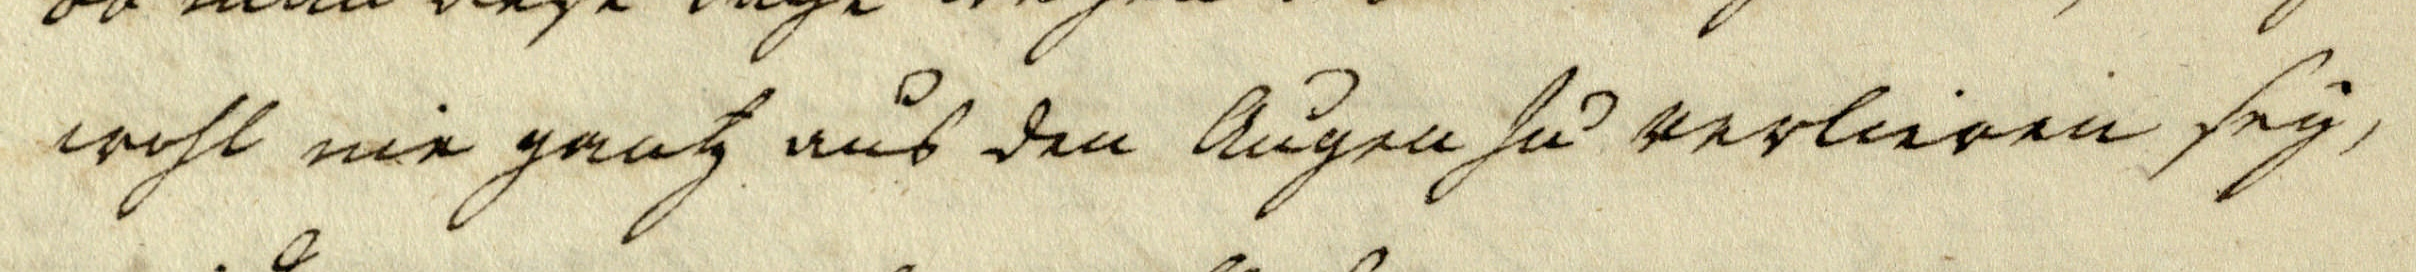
wohl nie gantz aus den Augen zu verlieren seÿ,
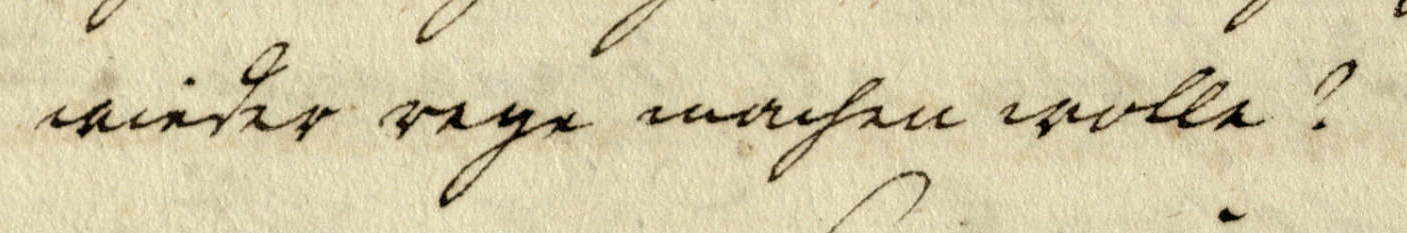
wieder rege machen wolle ?
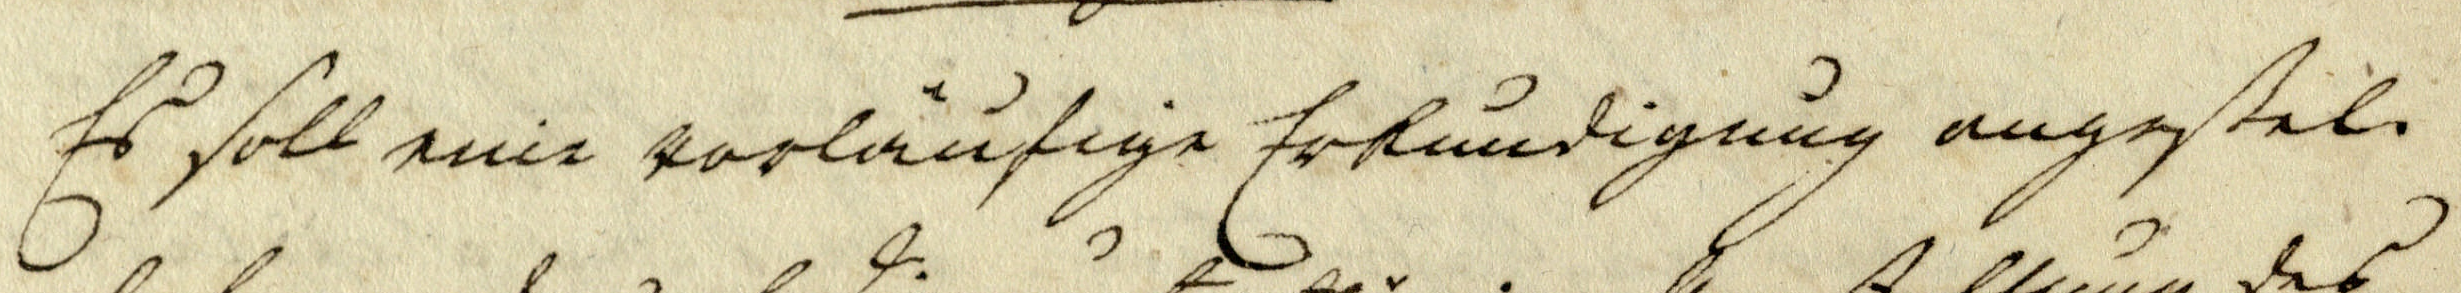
Es soll eine vorläufige Erkundigung angestel¬
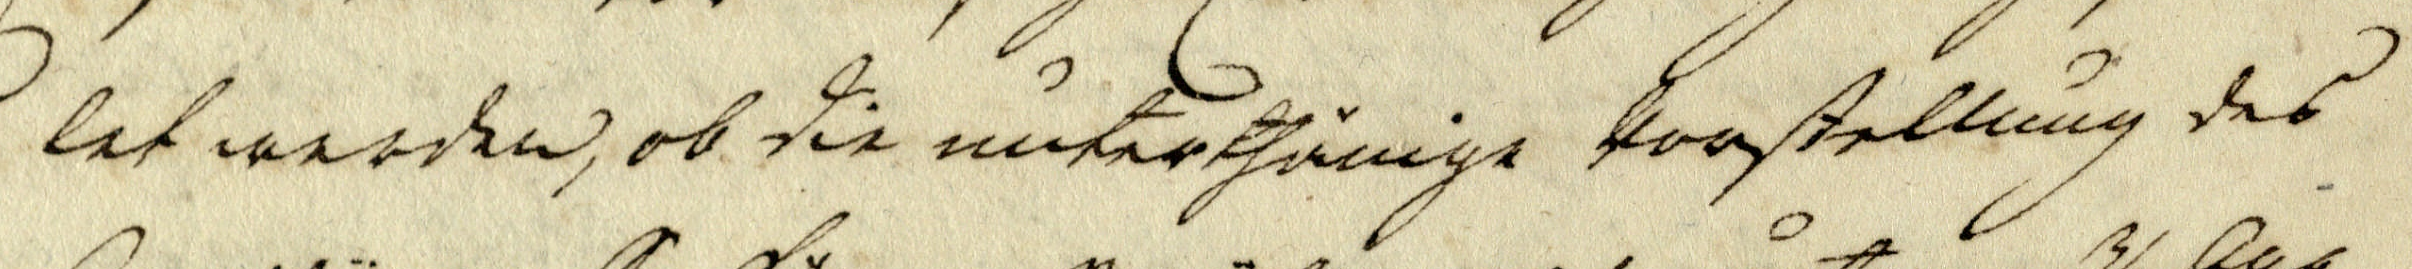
let werden, ob die unterthänige Vorstellung des
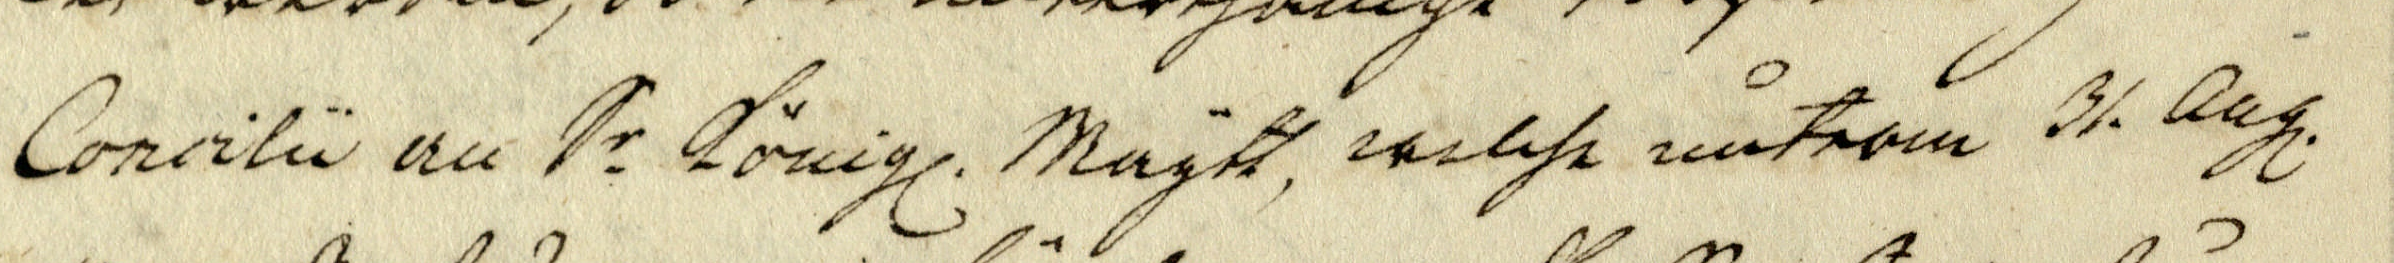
Concilii an Sr Königl. Maÿtt, welche unterm 31. Aug.
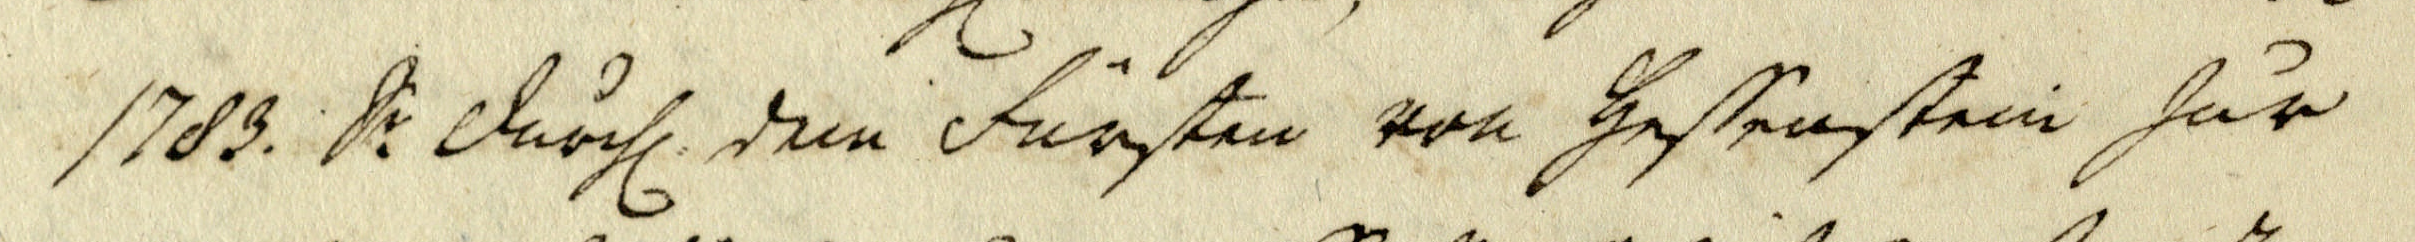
1783. Sr Durchl. dem Fürsten von Hessenstein zur
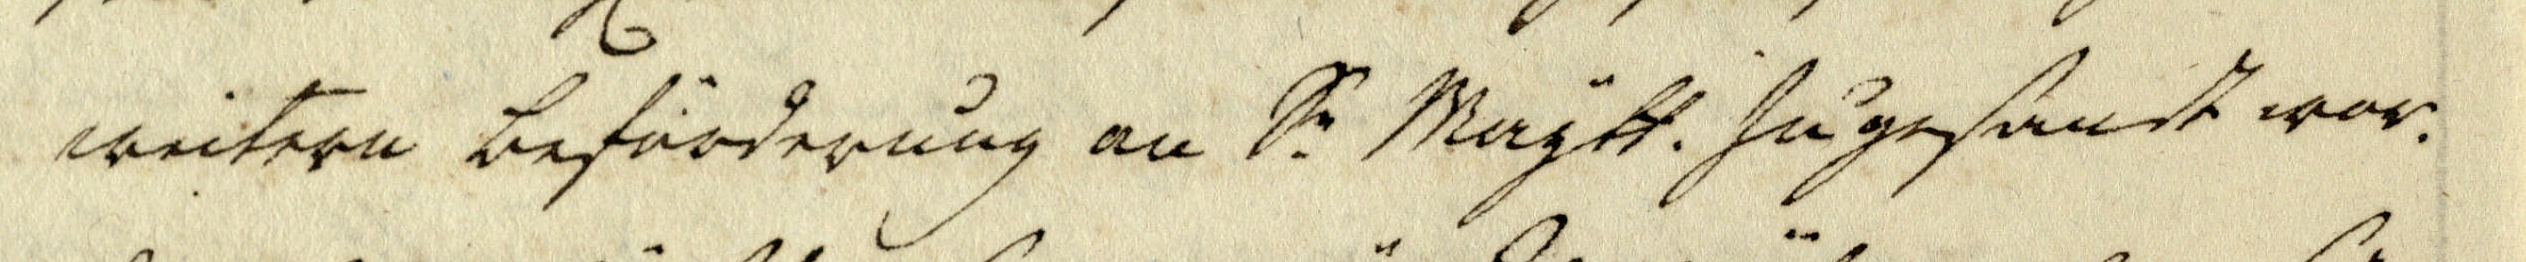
weitern Beförderung an Sr Maÿtt. zugesandt wor¬
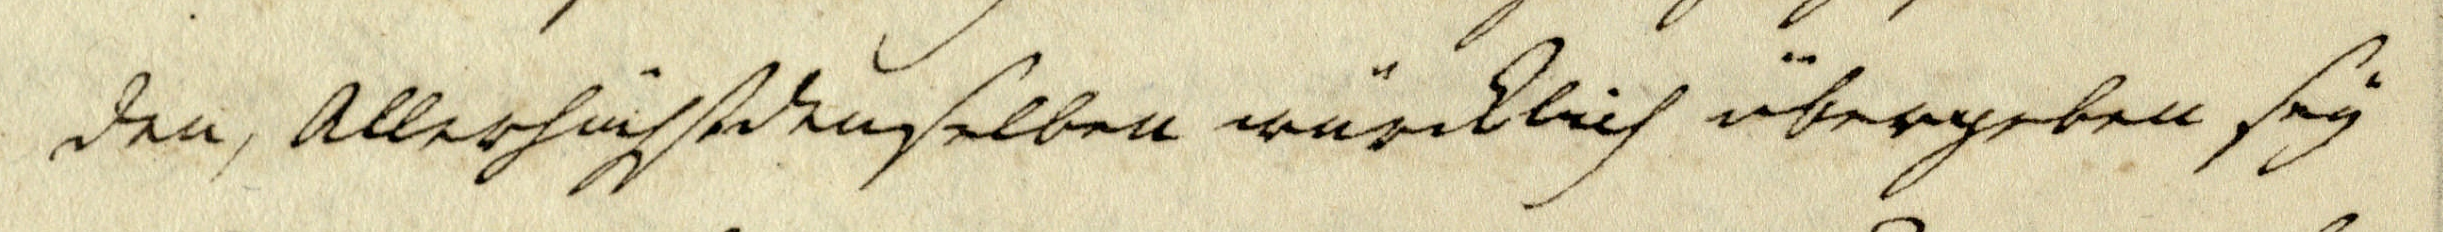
den, Allerhöchstdenselben würcklich übergeben seÿ
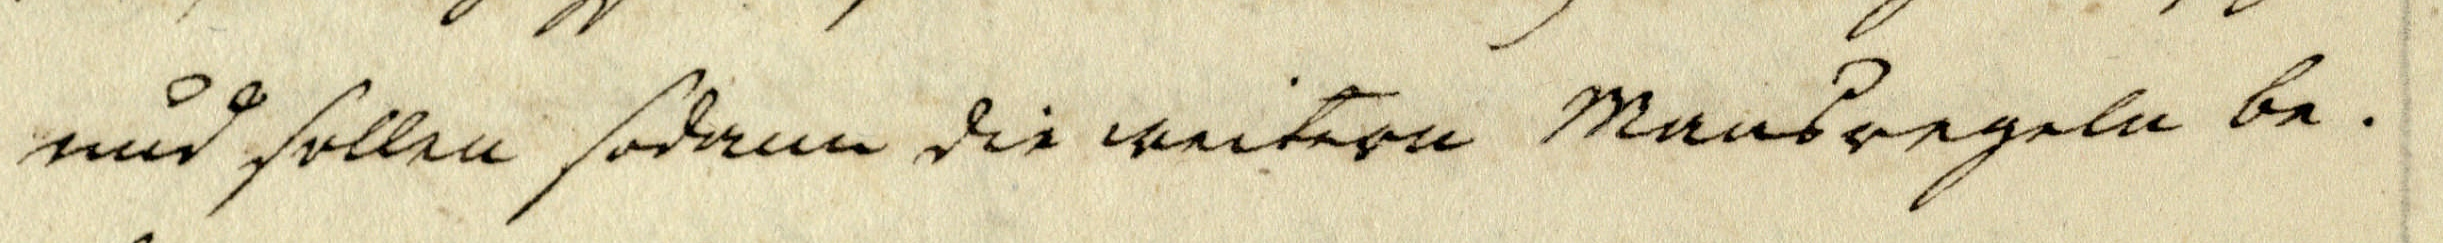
und sollen sodann die weitern Maasregeln be¬
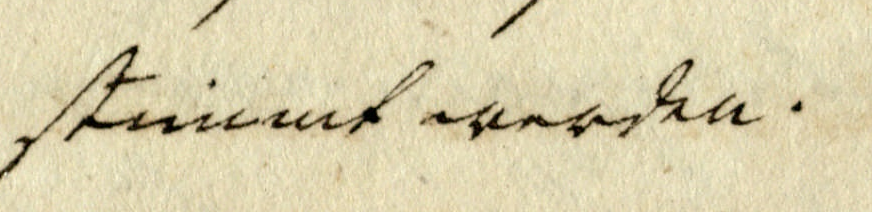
stimmt werden.
